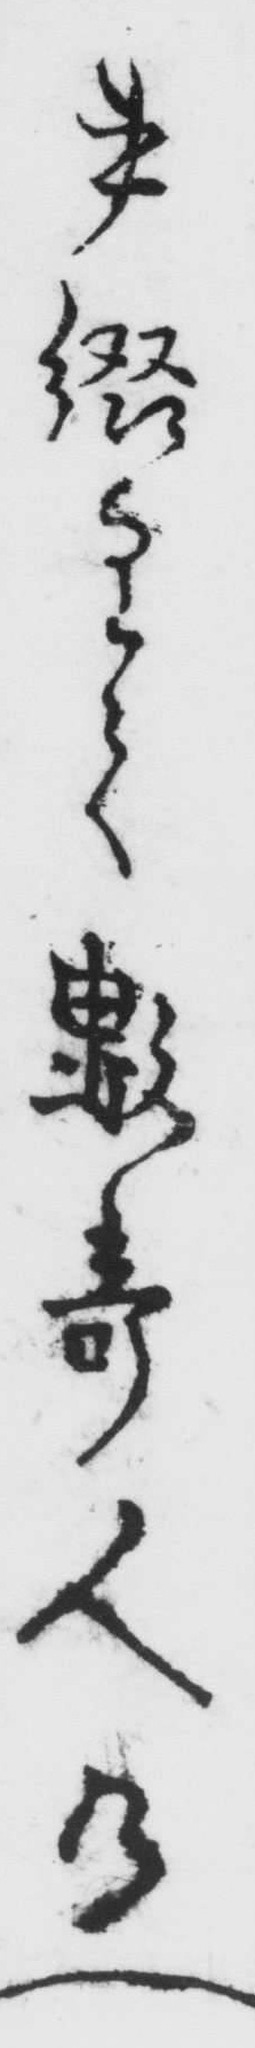書綴りて数奇人の

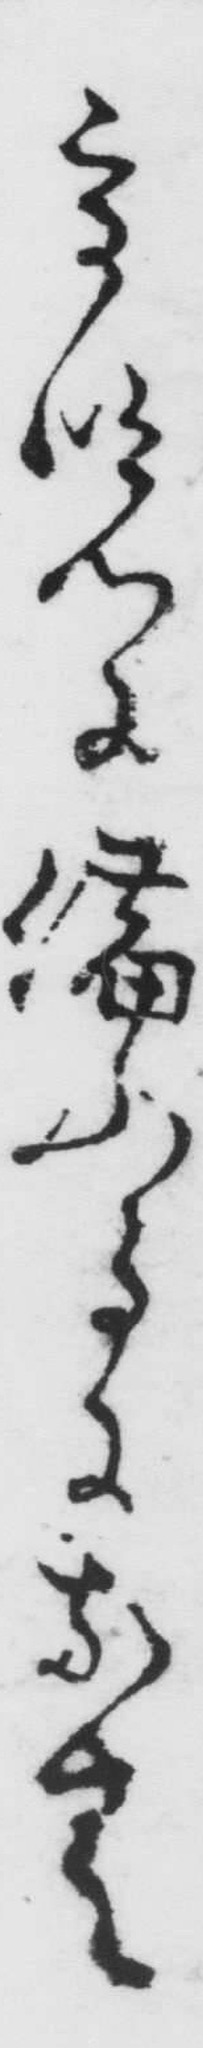高覧に備ふるになむ
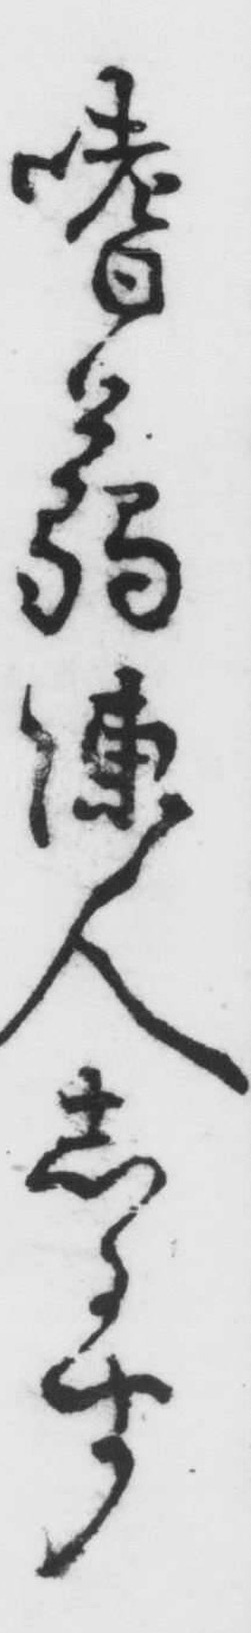嗜蒻陳人しるす
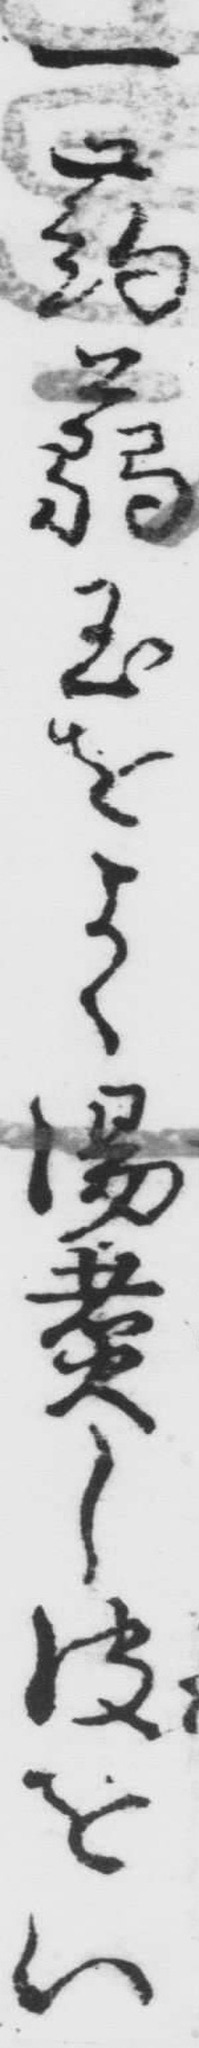一蒟蒻玉をよく湯煮し皮をい
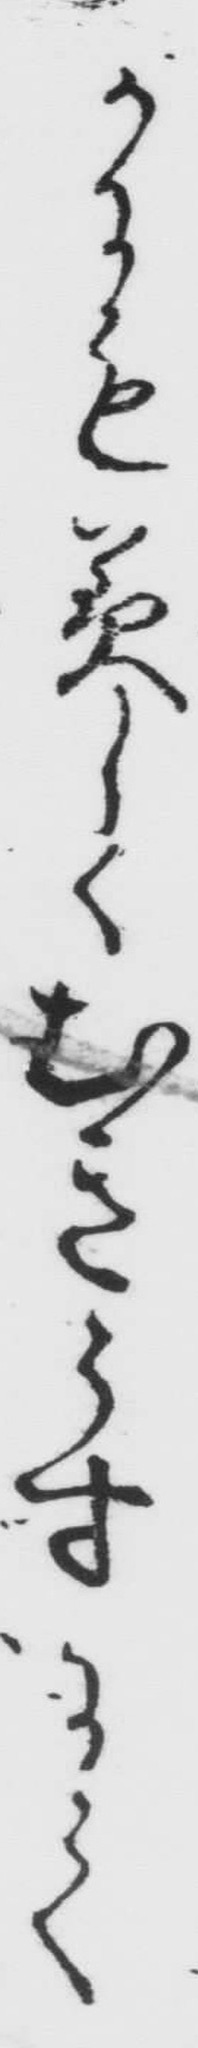かにも美しくむきうすにて
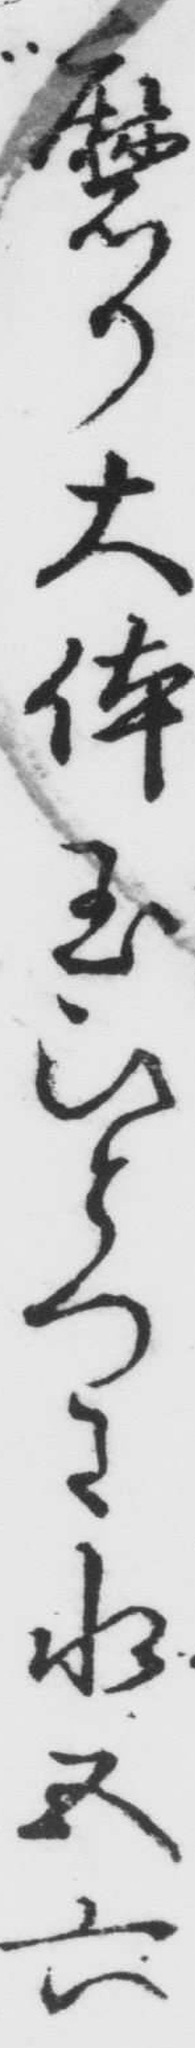磨り大体玉ひとつに水五六
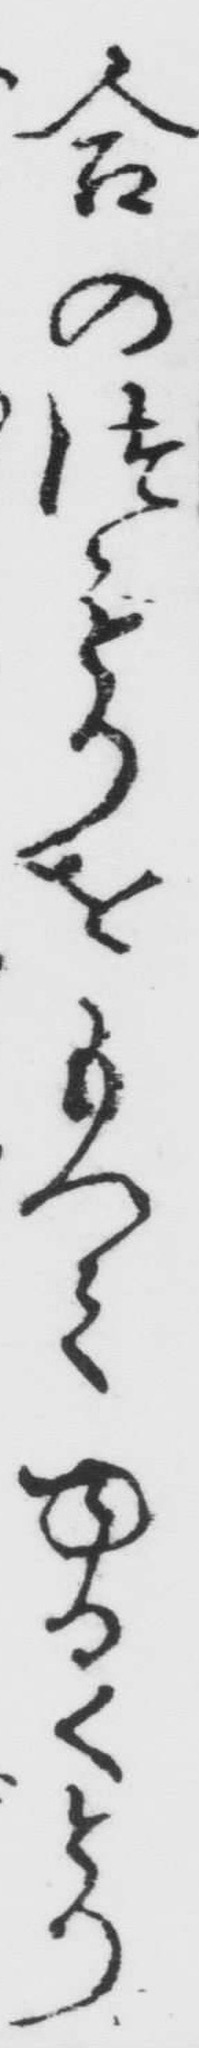合のつもりをもつてゆるくとり
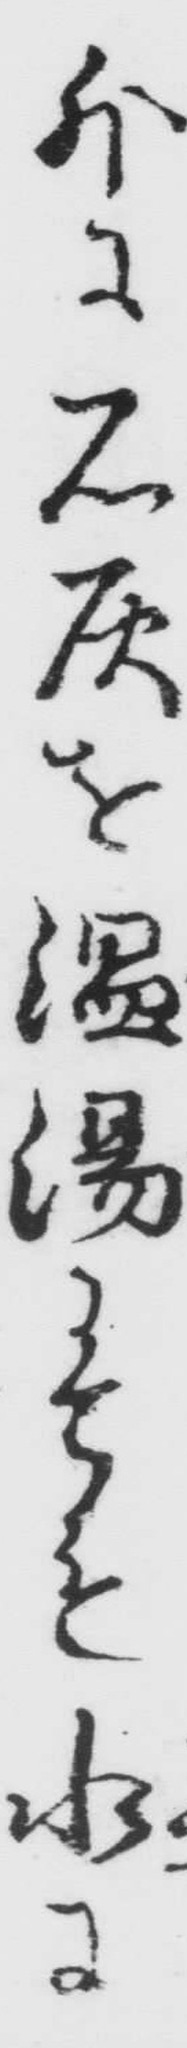外に石灰を温湯にても水に
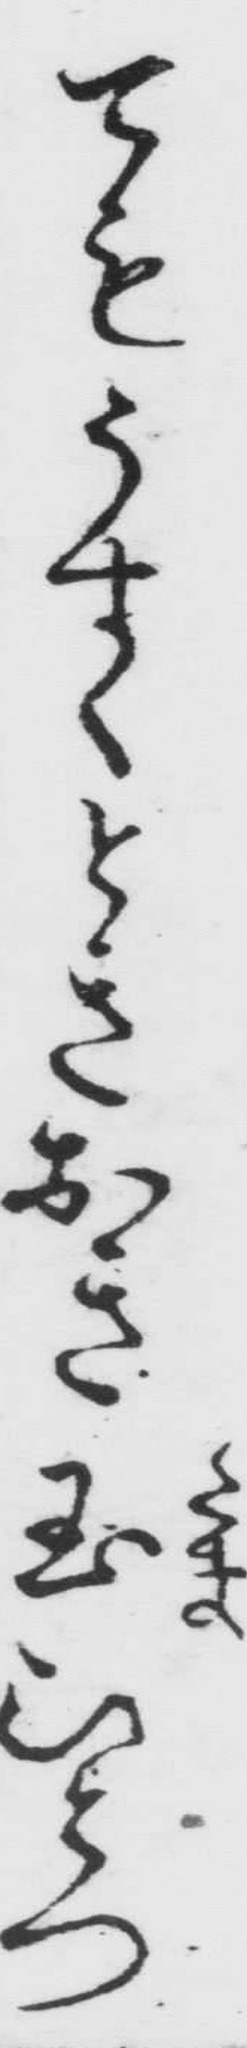てもうすくときおき玉ひとつ

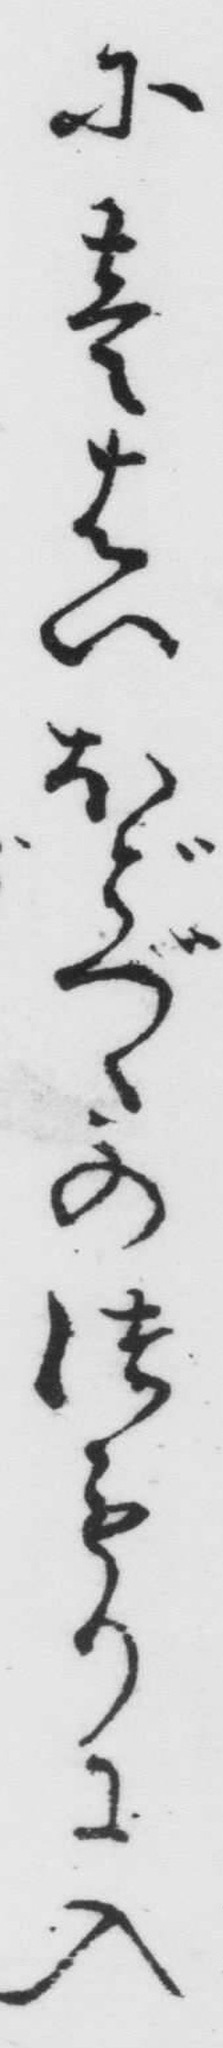に壱はいほどづゝのつもりに入
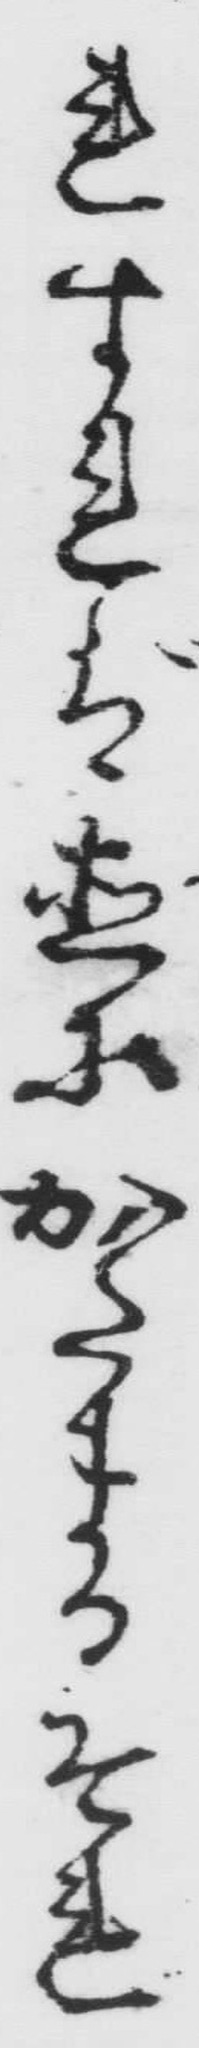れすれば直にかたまるそれ
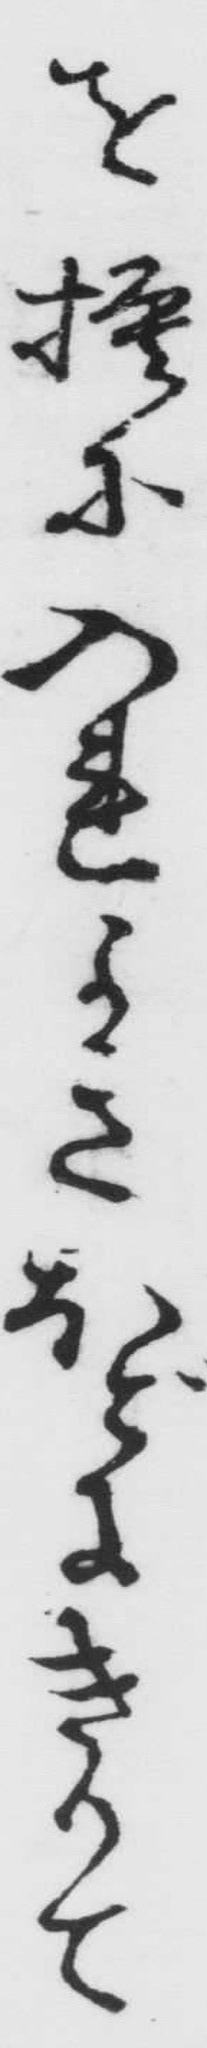を模に入れよきほどにきりて
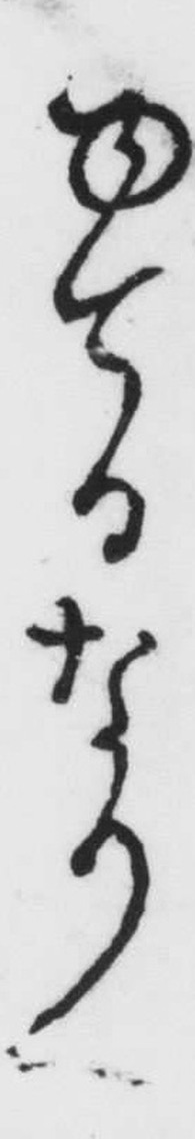ゆてるなり
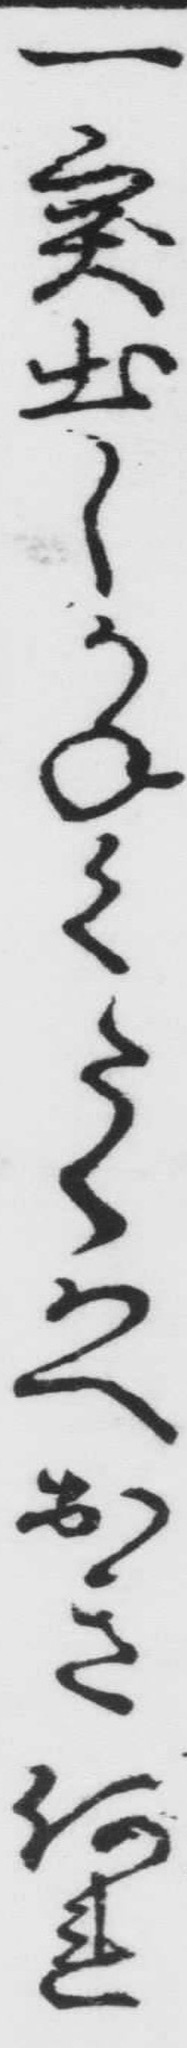一突出しかねてたくはへおき何れ
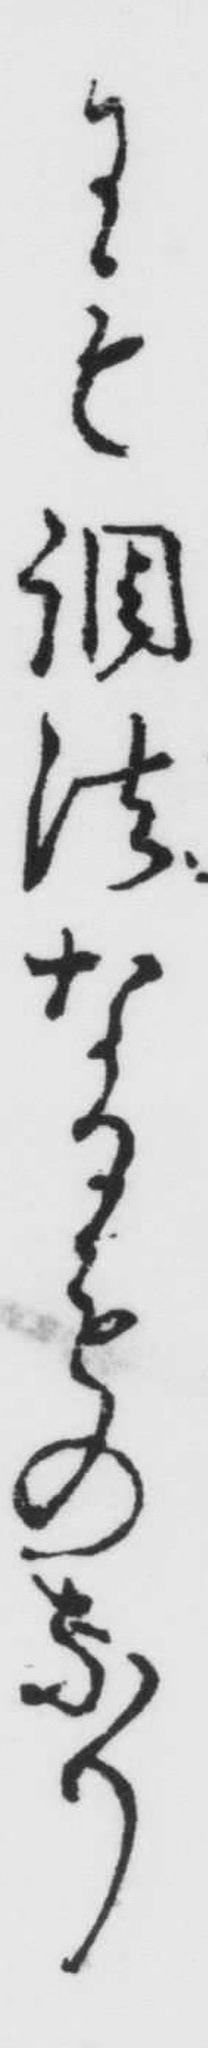にも調法なるものなり
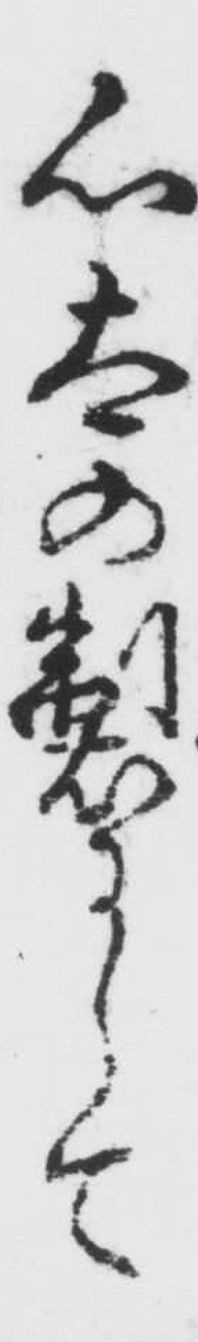心太の製にして
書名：蒟蒻百珍
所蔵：大阪府立大学学術情報センター 国文学研究資料館
